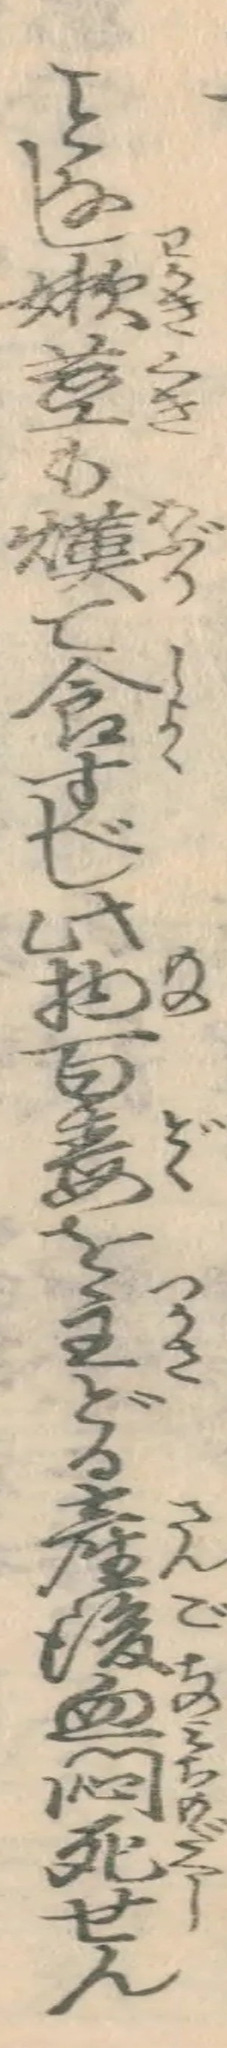ことなし嫰茎も熯て食すべし此物百毒を主どる産後血悶死せん
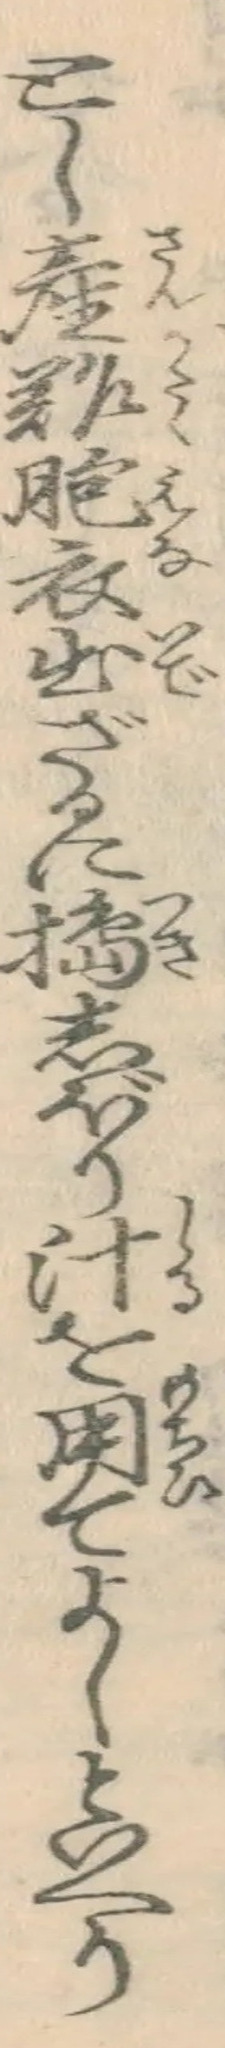とし産難胞衣出ざるに搗しぼり汁を用てよしといへり
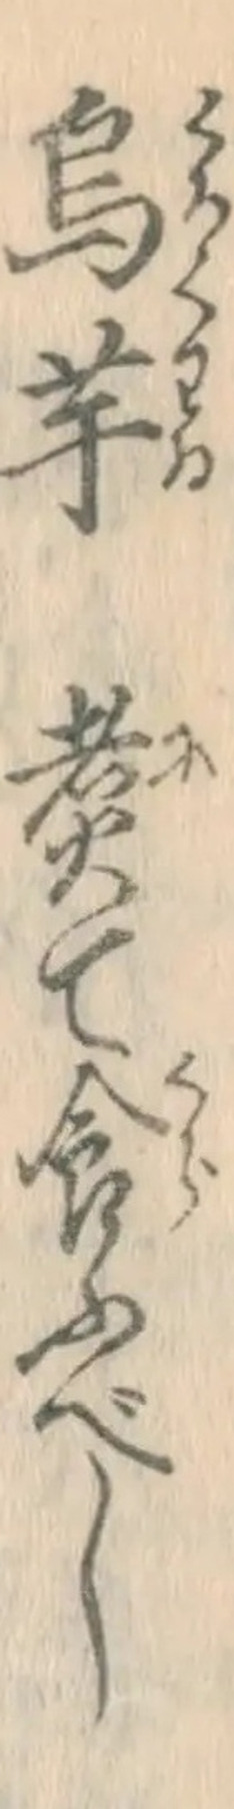烏芋煑て食ふべし
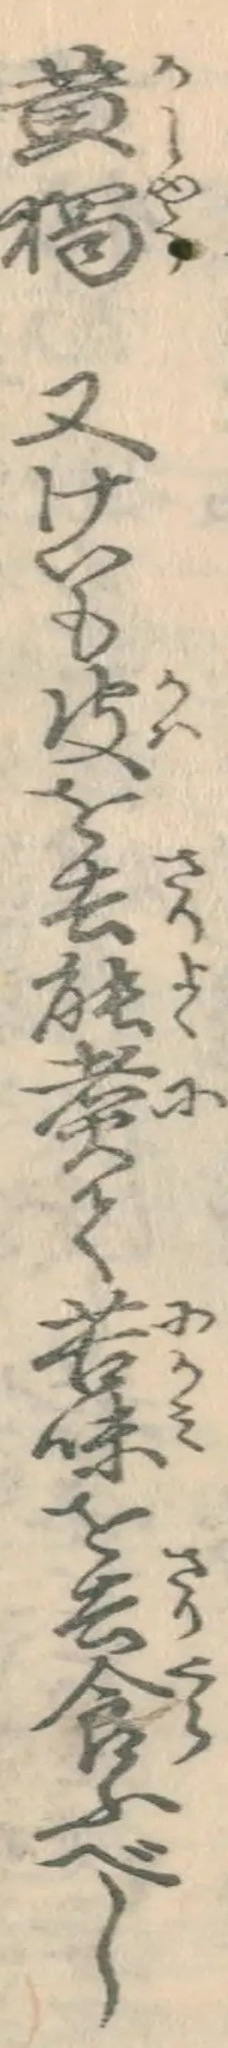黄獨又けいも皮を去能煑て苦味を去食ふべし
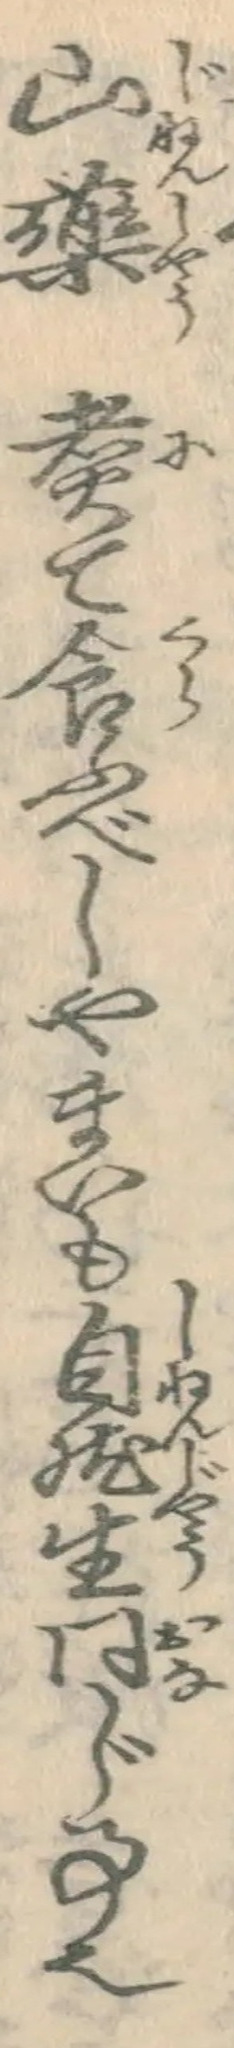山薬煑て食ふべしやまいも自然生同じ事也

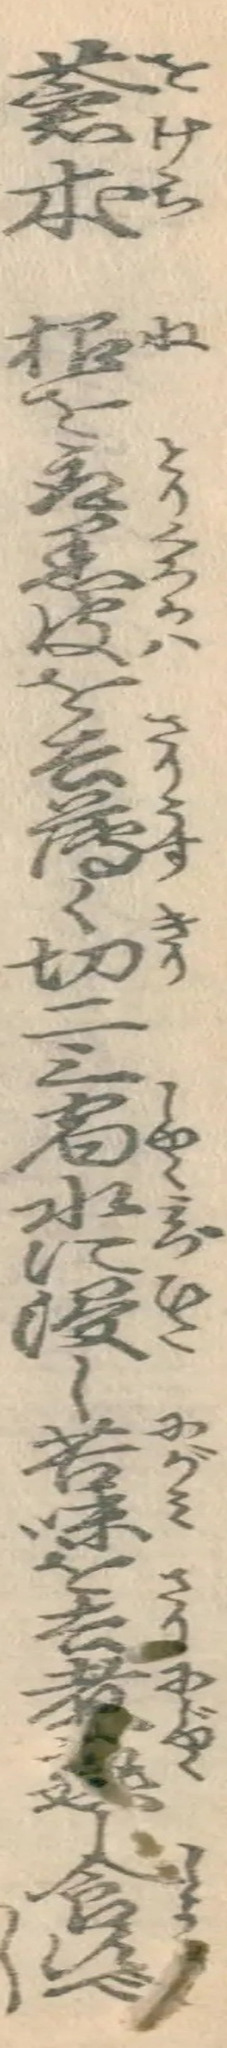蒼朮根を取黒皮を去薄く切二三宿水に浸し苦味を去煑熟し食すべし
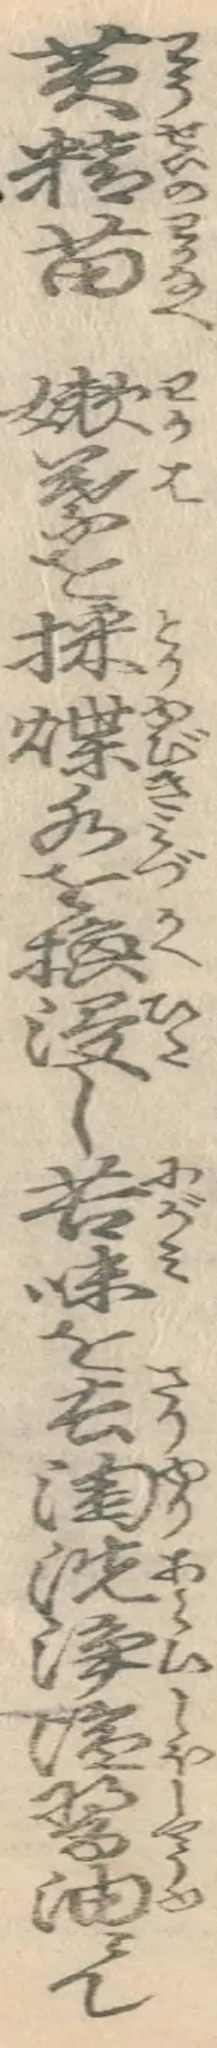黄精苗嫰葉を採煠水を換浸し苦味を去淘洗浄塩醤油にて
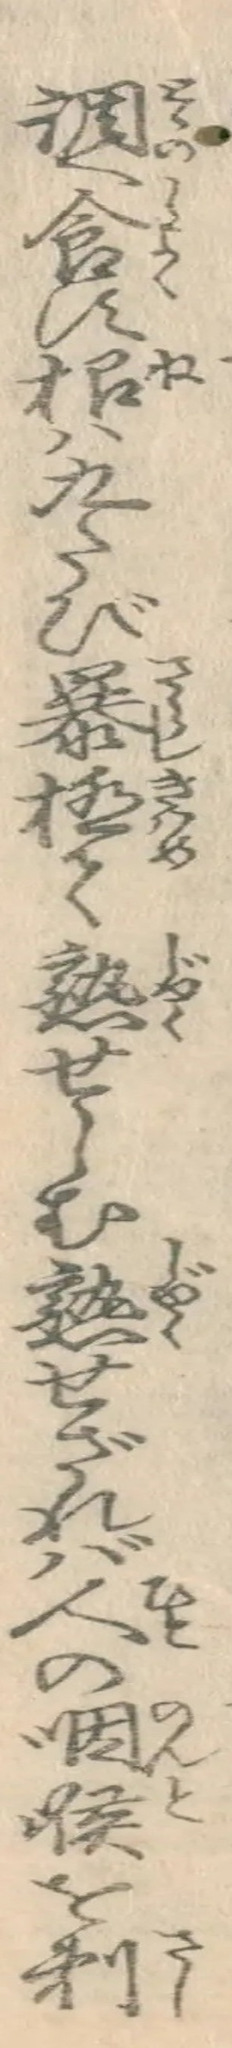調へ食す根は九たび暴極て熟せしむ熟せざれば人の咽喉を刺
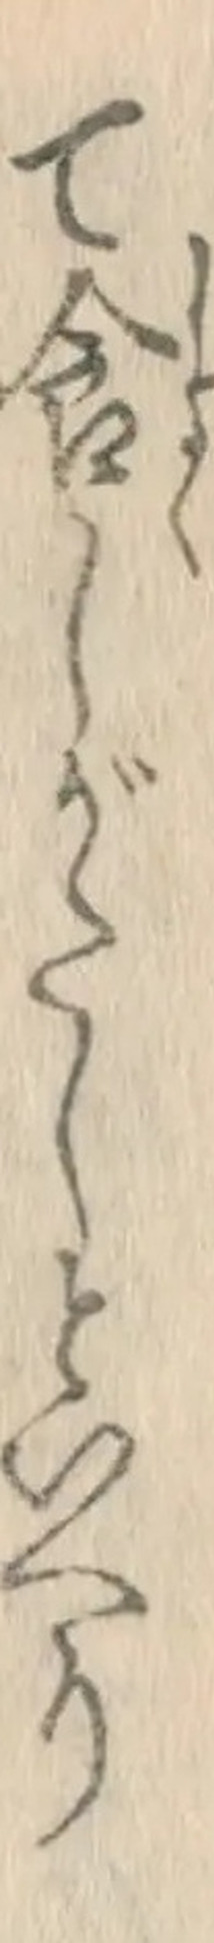て食しがたしといへり
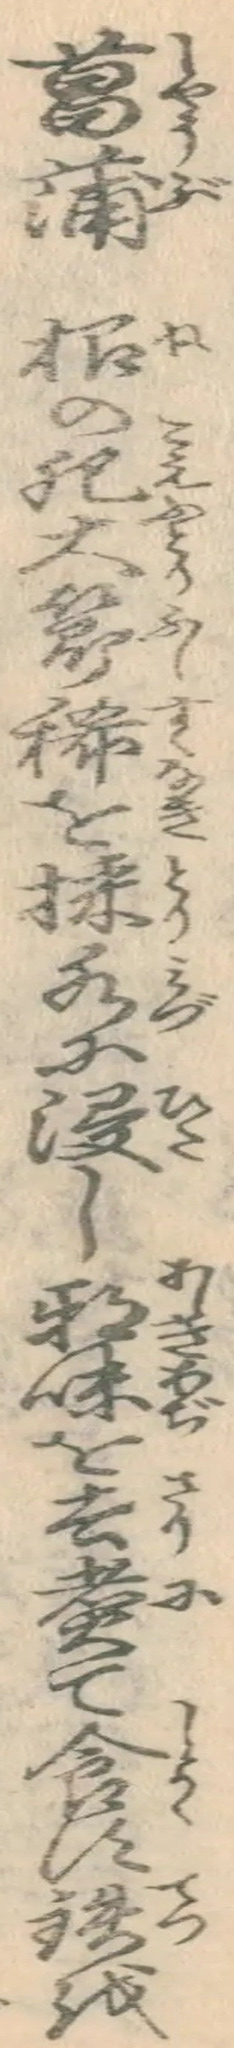菖蒲根の肥大節稀を採水に浸し邪味を去煑て食す鉄を
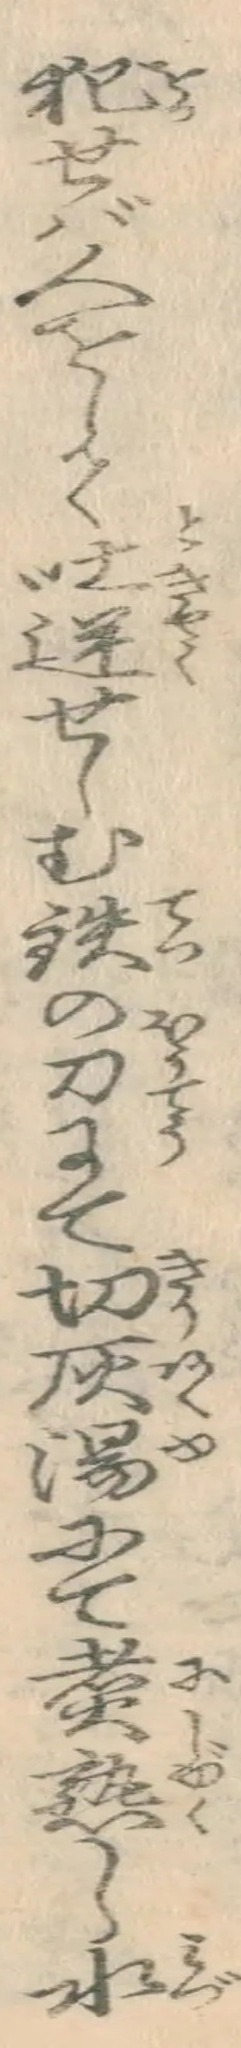犯せば人をして吐逆せしむ鉄の刀にて切灰湯にて煑熟し水
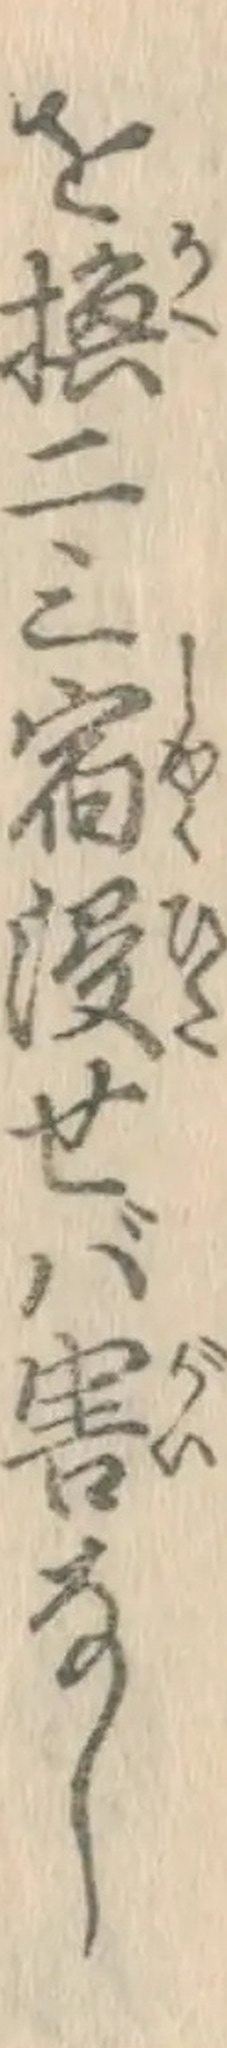を換二三宿浸せば害なし
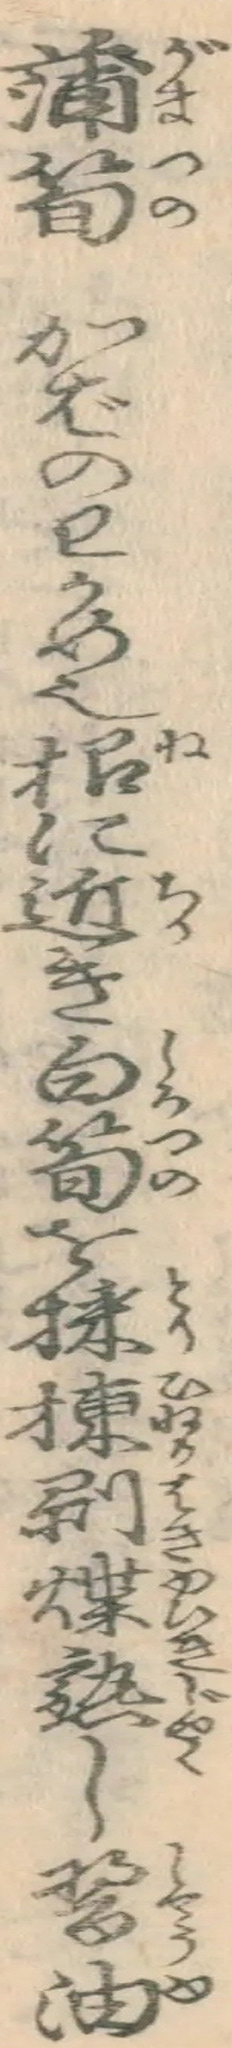蒲筍かばのわかめ也根に近き白筍を採棟剥煠熟し醤油
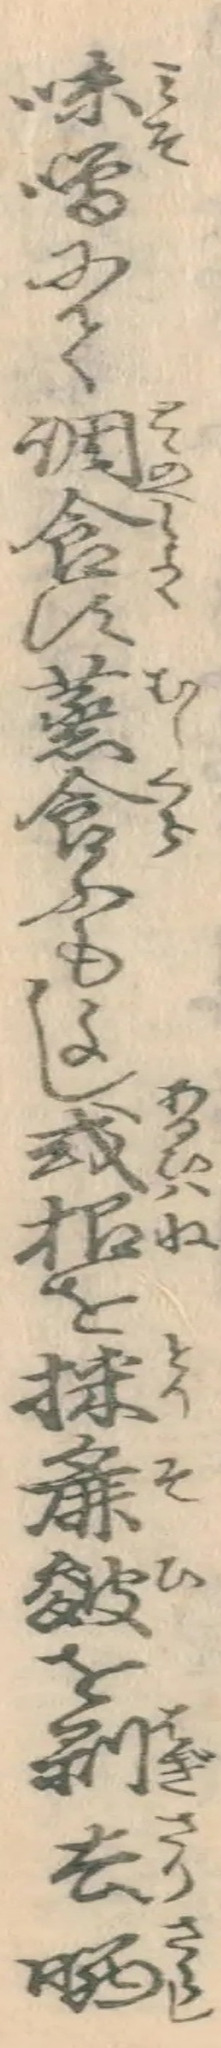味噌にて調食す蒸食ふもよし或根を採麁皴を剥去晒
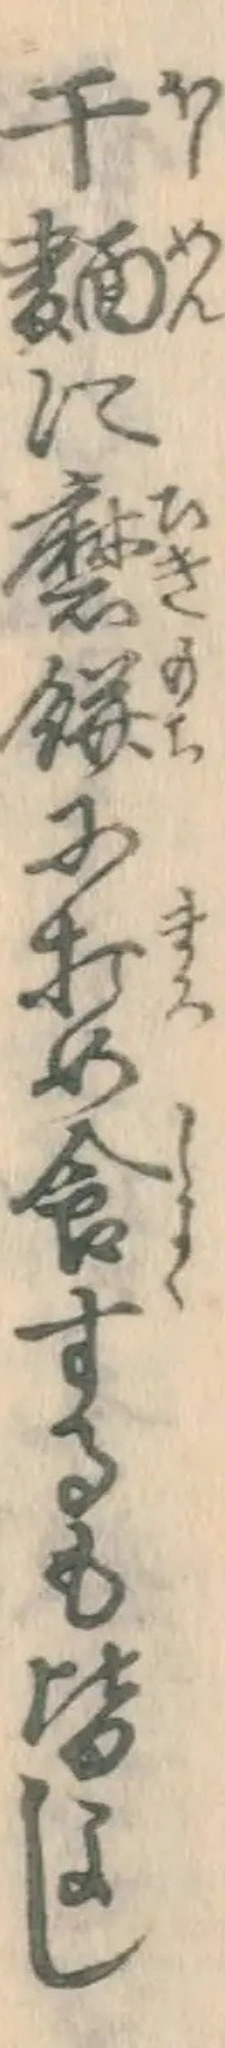干麺に磨餅に打め食するも皆よし

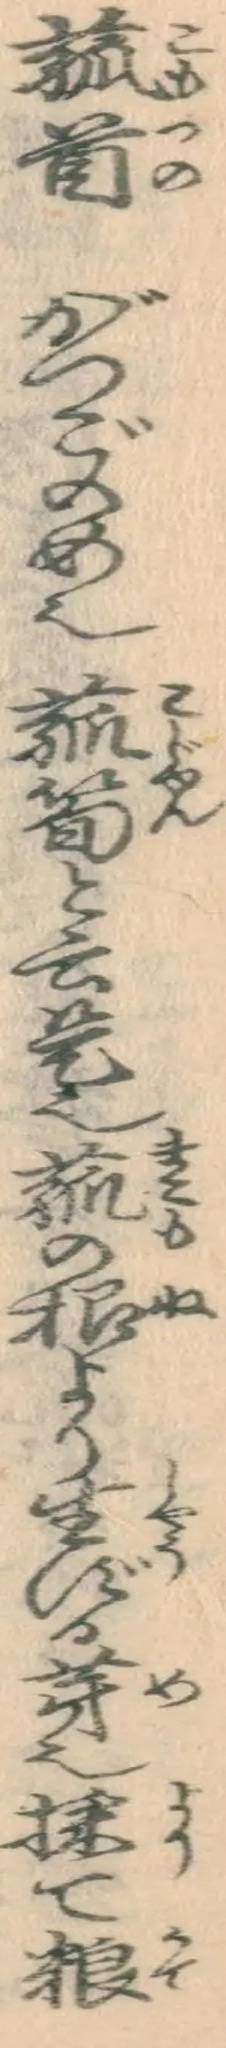菰首がつごのめ也菰筍と云是也菰の根より生ずる芽也採て粮
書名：経済をしへ草
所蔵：国立国会図書館 National Diet Library, JAPAN
